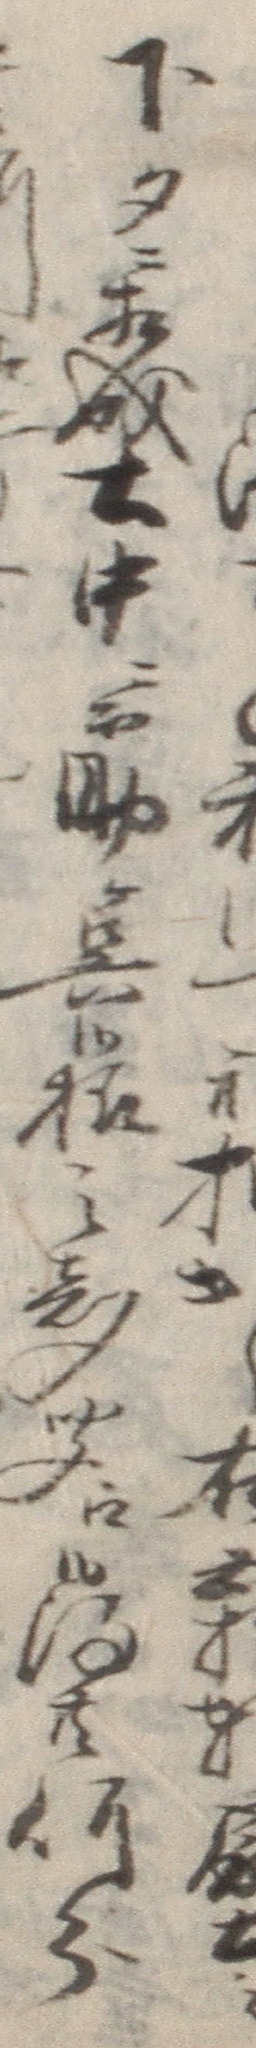下タニ相成土中ニ而助ヶ呉候様之声聞江候得共何分
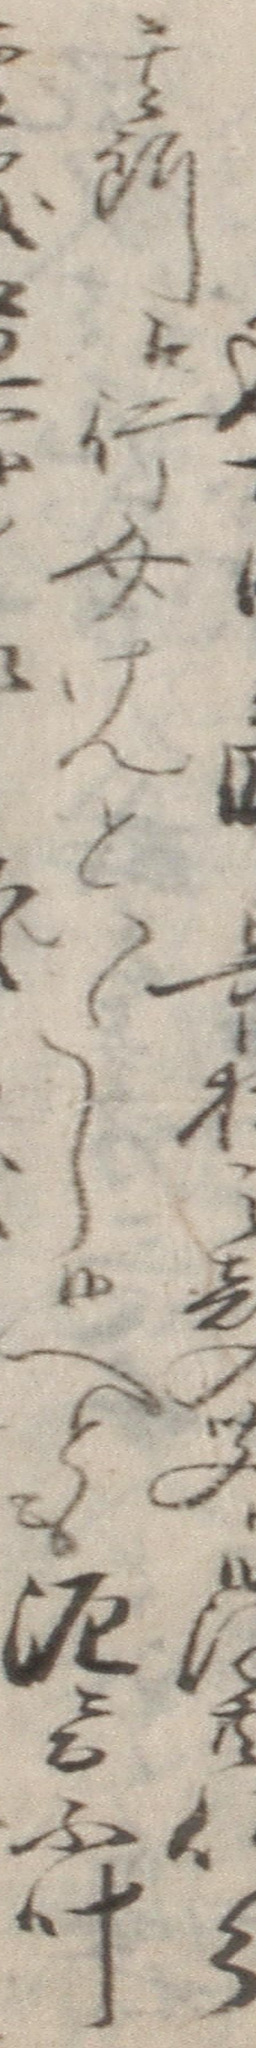其所江行介けんといたし候へとも泥ニ而不叶
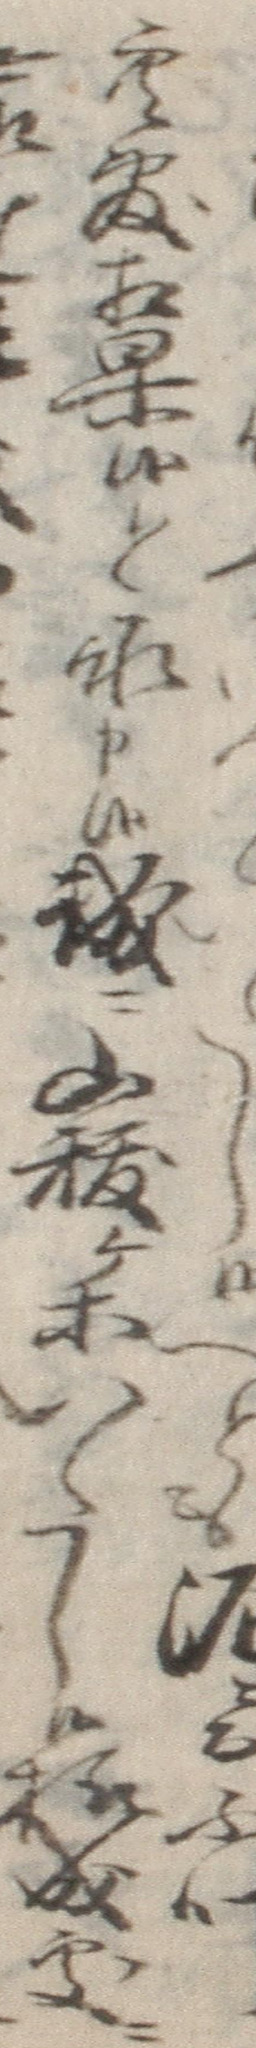空敷相果候と承申候誠ニ山抜ヶ等いたし候様成處ニ
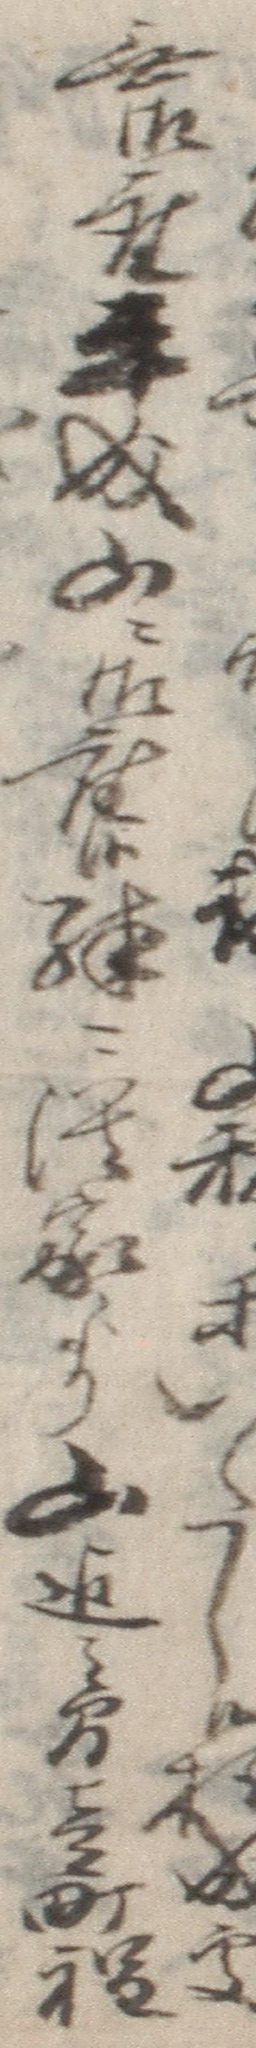無御座平成山ニ御座候殊ニ潰家より山迠之間壱町程
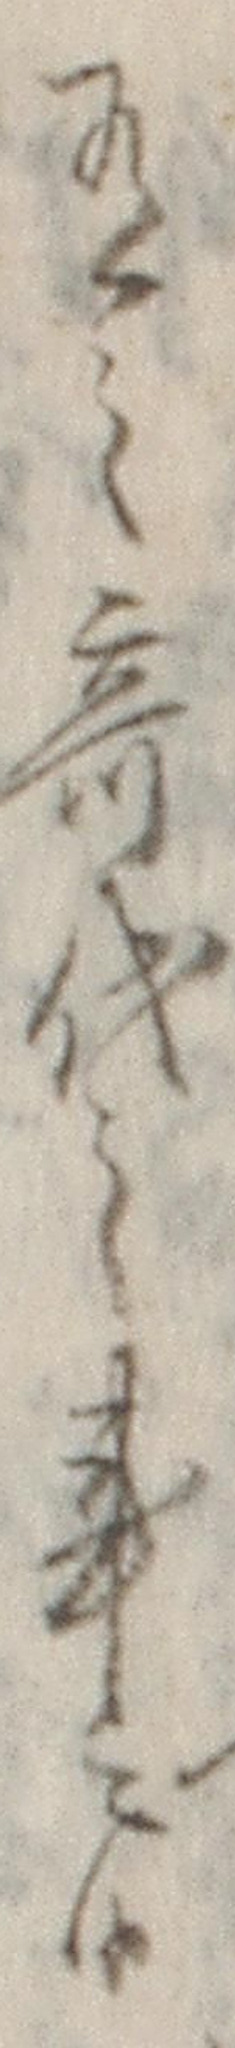有之奇代之事ニ候
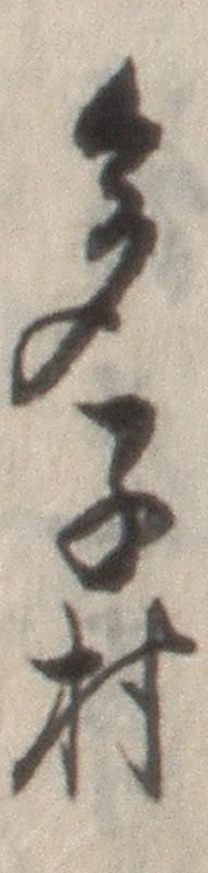多子村
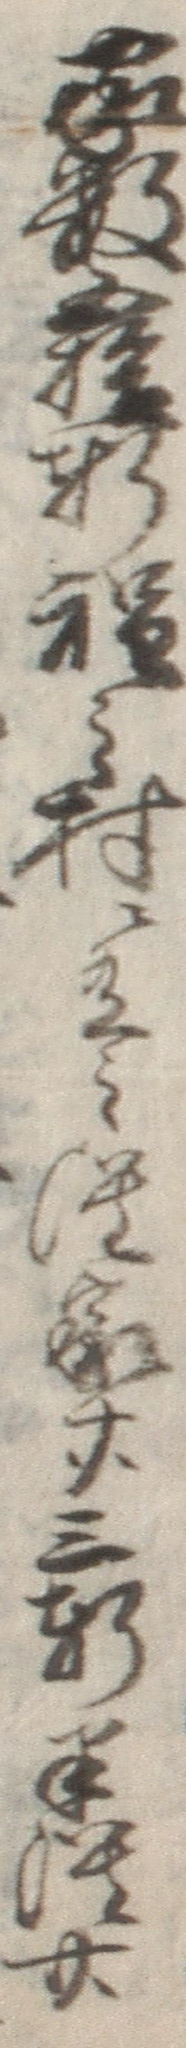家数五拾軒程之村ニ有之潰家等三軒半潰廿
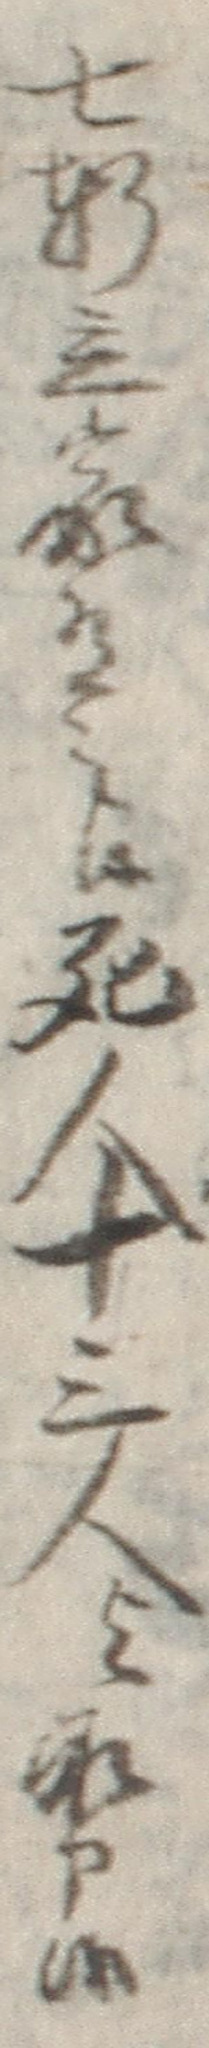七軒立家有之候死人十三と承申候
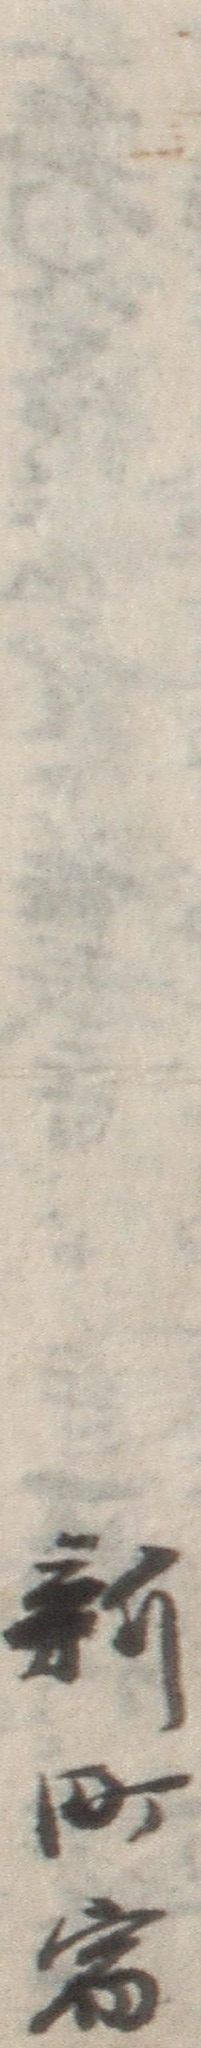新町宿
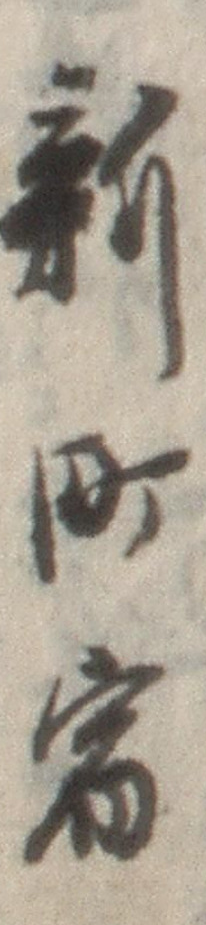新町宿
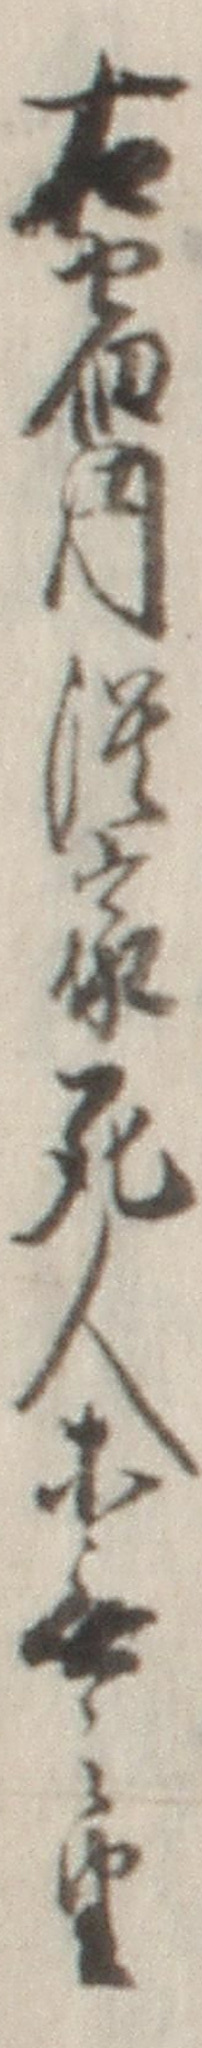右宿内潰家死人等無之由

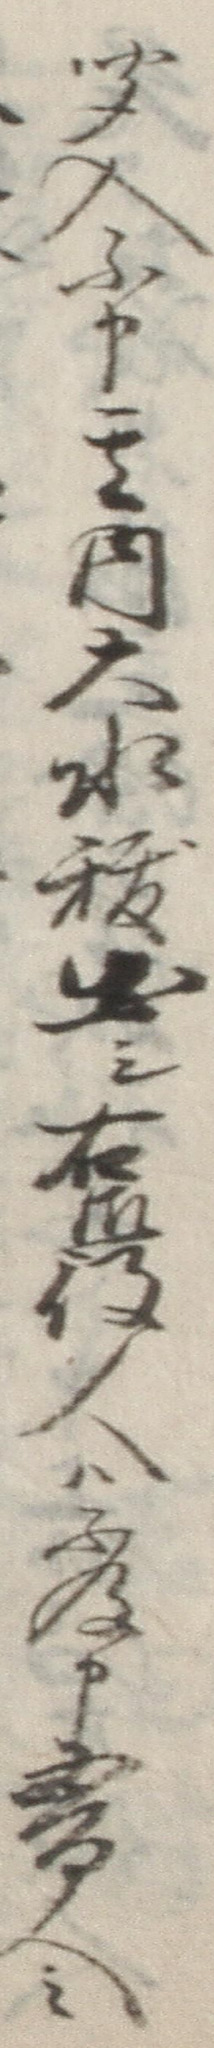聞入不申其内大水抜出シ右御役人ハ不及申五百人之
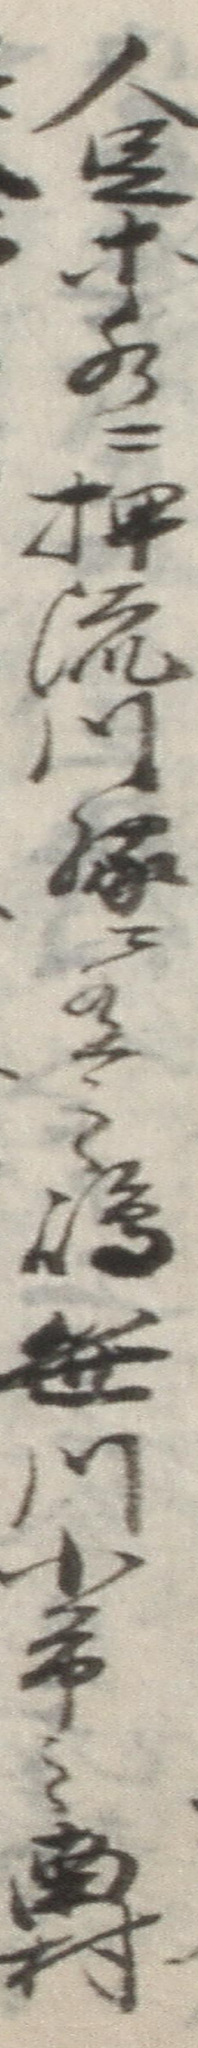人足等水ニ押流川縁ニ有之嶋笹川小市之両村
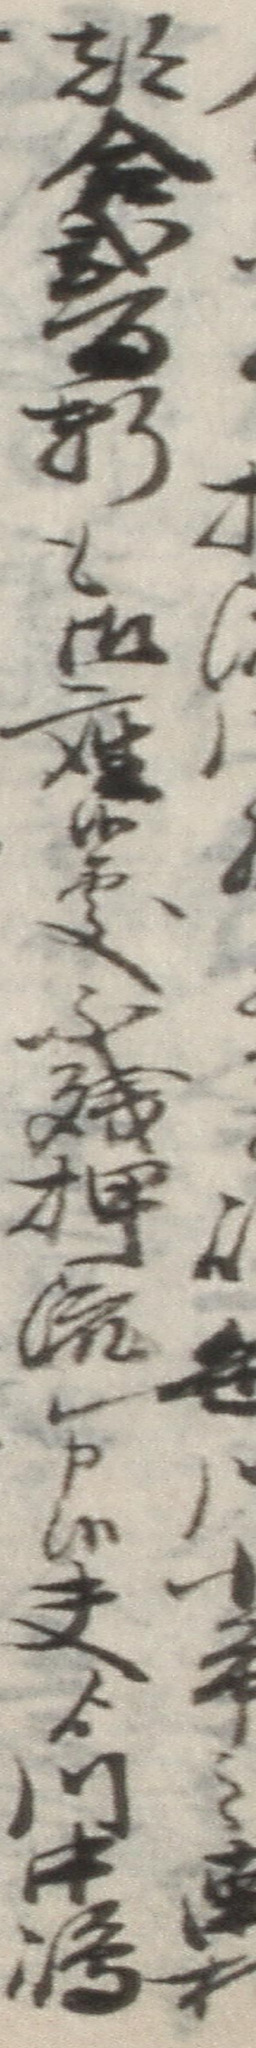都合弐百軒も御難候処不残押流レ申候夫ゟ川中島
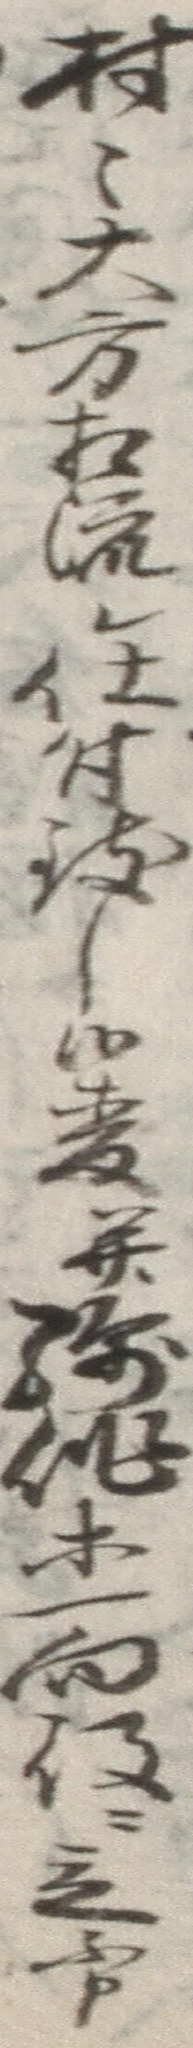村之大方相流レ仕付致し候麦并残作等一向役ニ立不申
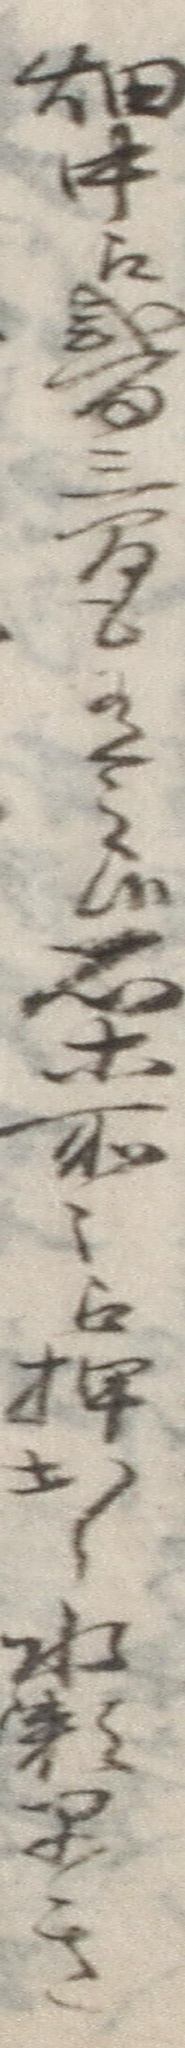畑中え弐百間三間も有之石等所々え押出し水瀬早き
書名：[善光寺地震に関する冊子]
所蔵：東京大学地震研究所図書室 Earthquake Research Institute Library, The University of Tokyo, JAPAN
